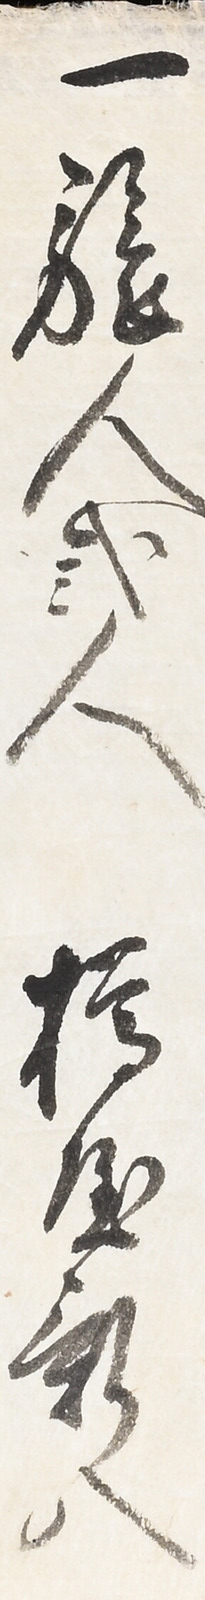一旅人弐人樽屋新八
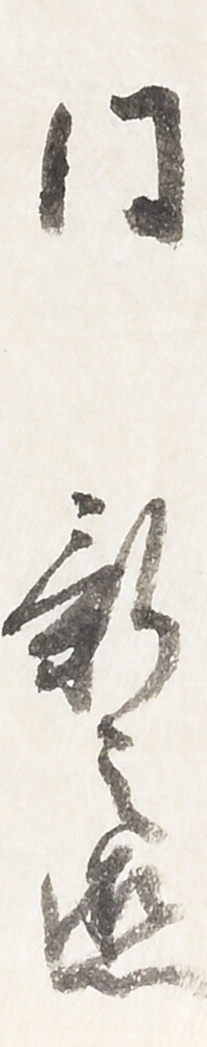同新之丞
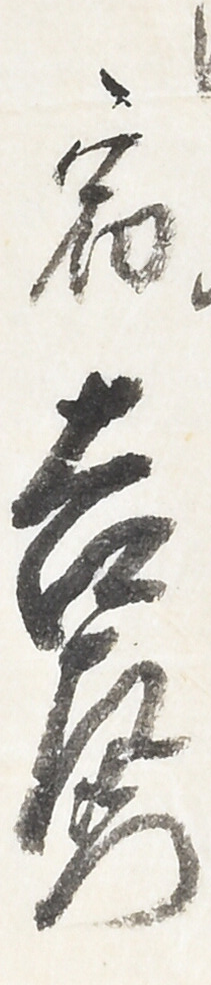宿吉左衛門
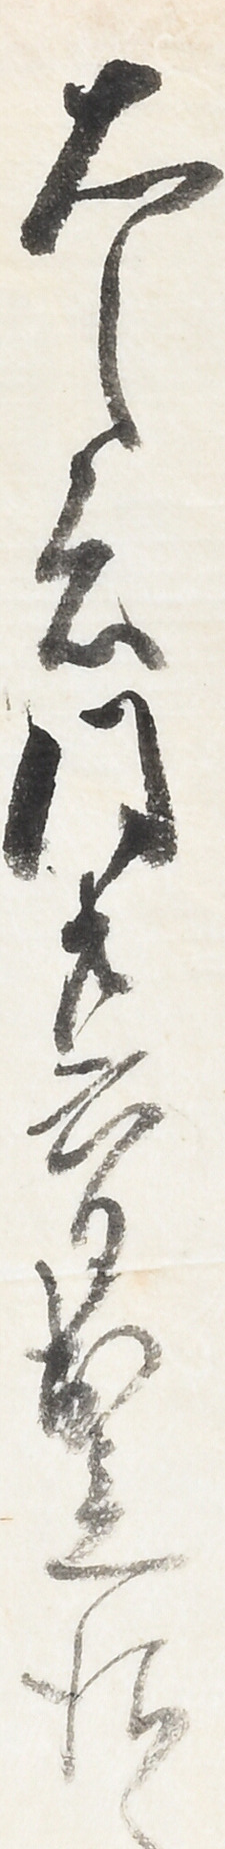右之者同廿六日出立仕候
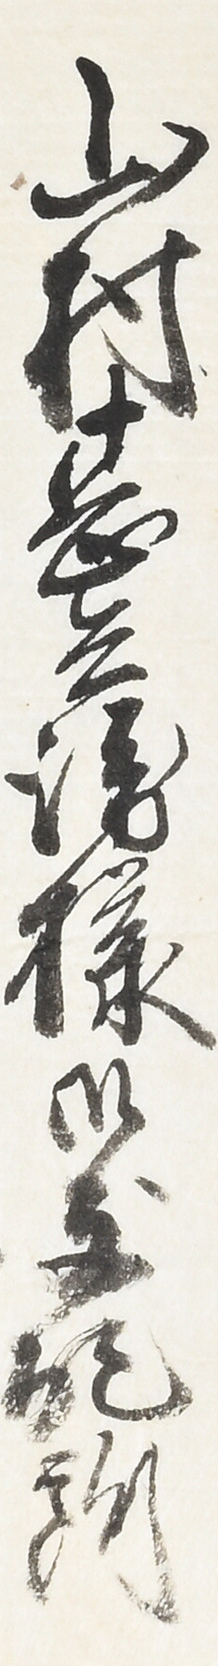山村甚兵衛様御支配所
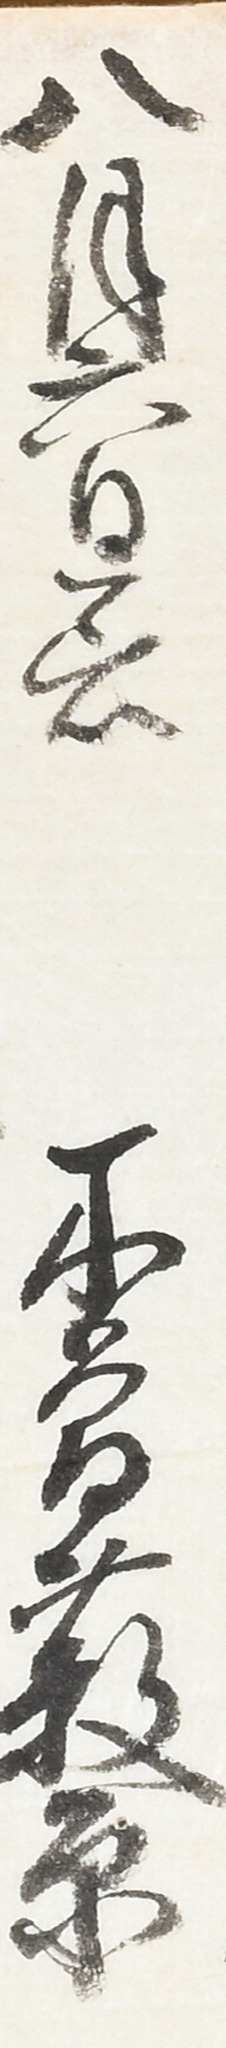八月六日着木曽藪原
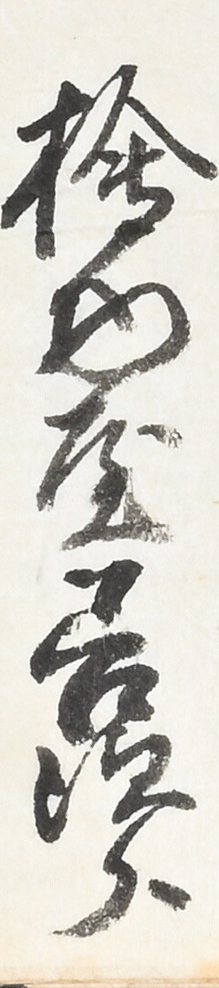檜物屋善次郎
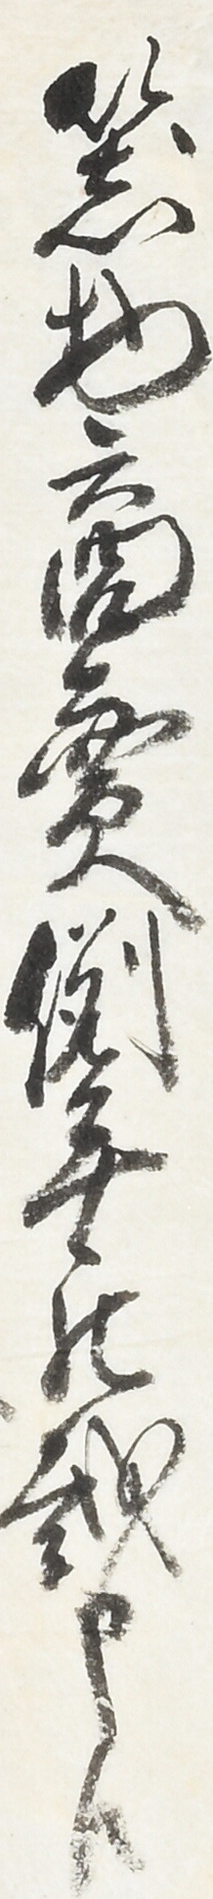器物商売例年罷越申候
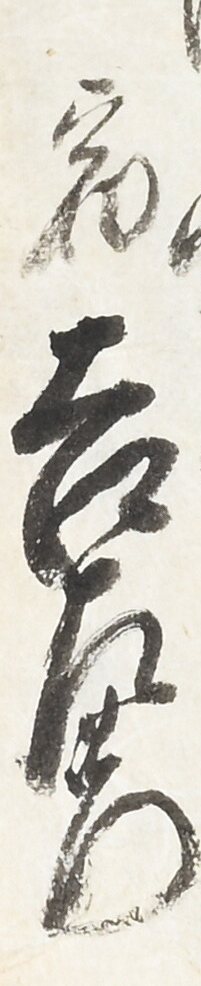宿吉左衛門

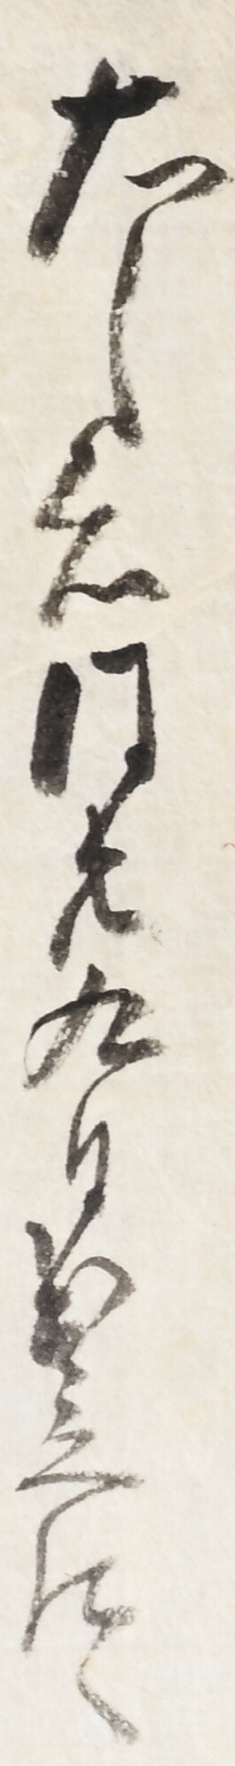右之者同廿九日出立仕候
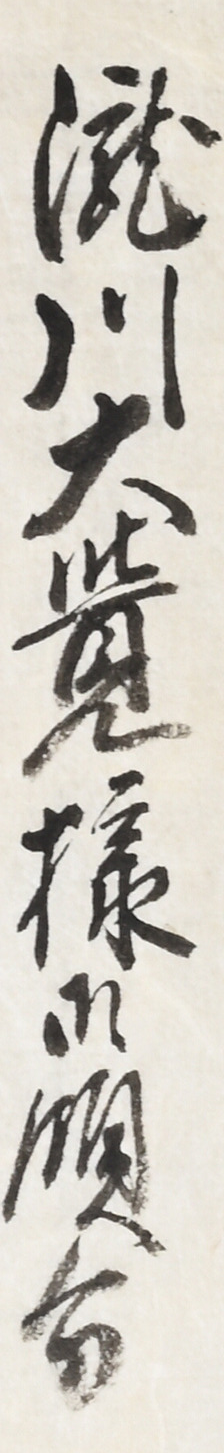瀧川大覚様御領分
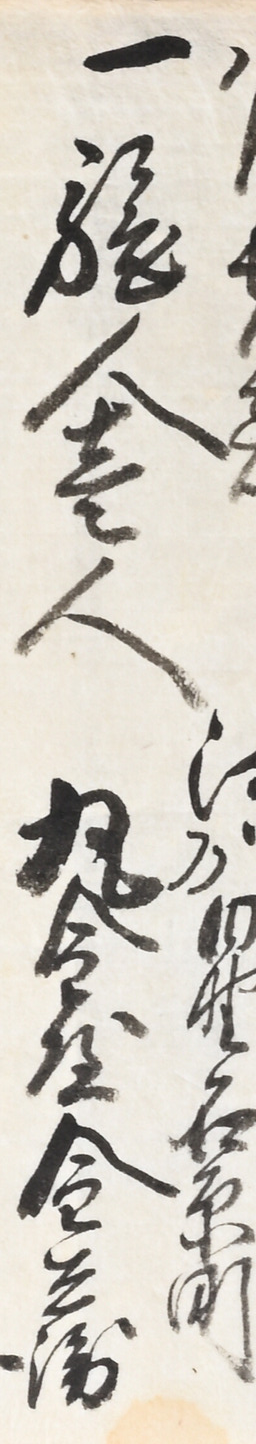一旅人壱人丸金屋金兵衛
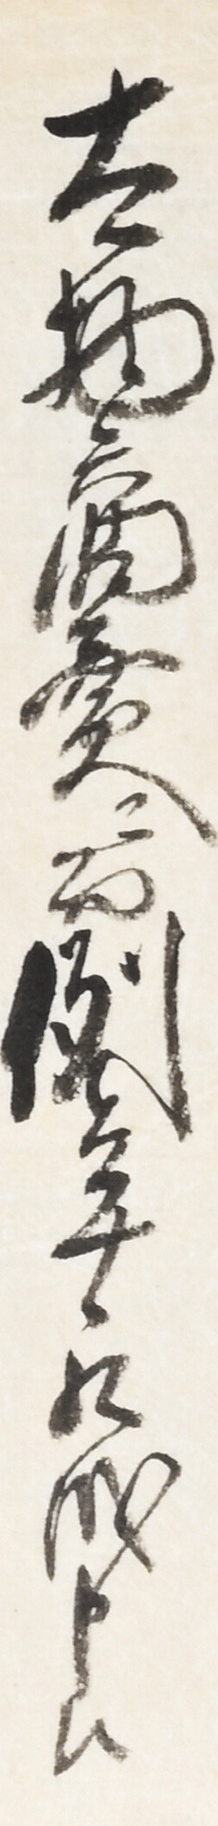太物商売ニ而例年罷越申候
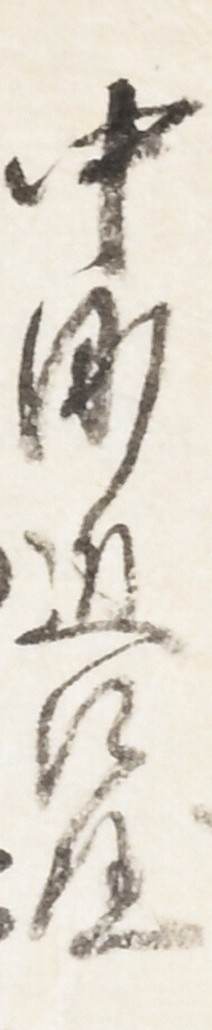中町近江屋
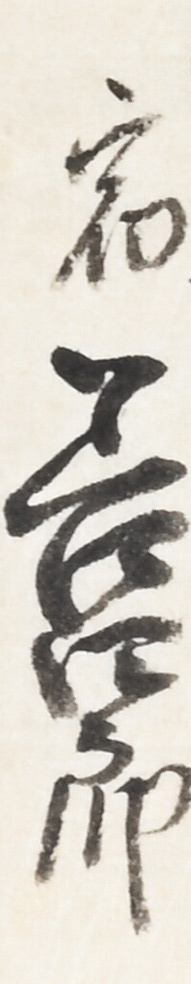宿善四郎
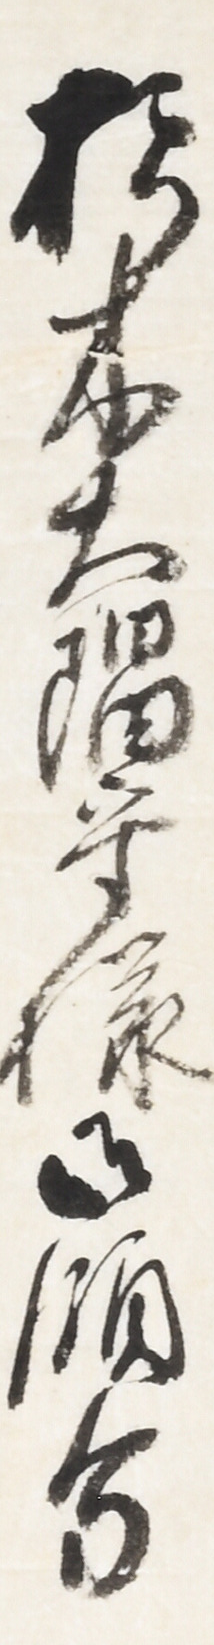朽木大隅守様御領分
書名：旅人泊控帳
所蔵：伊那市立高遠町図書館・合同会社AMANE
